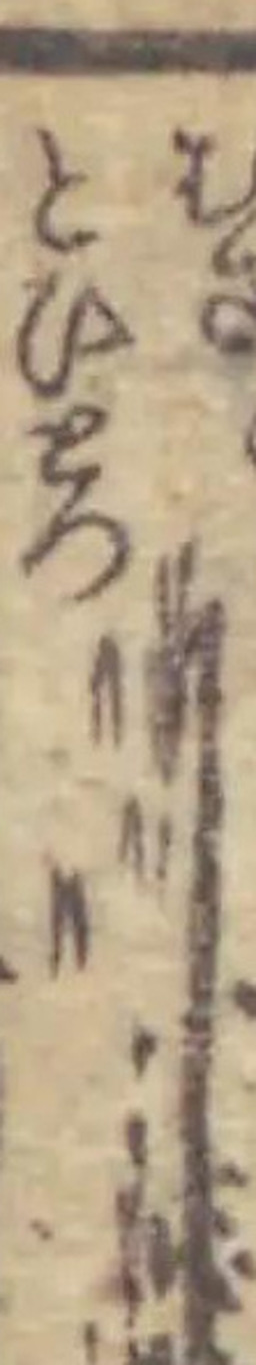とひとつ
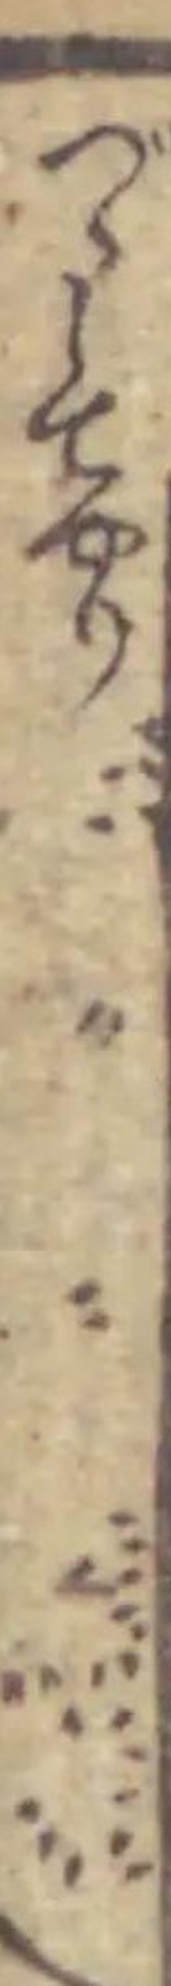づゝしてやり
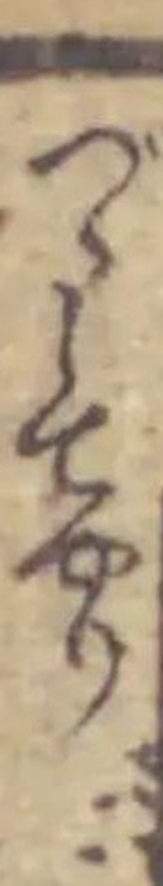づゝしてやり
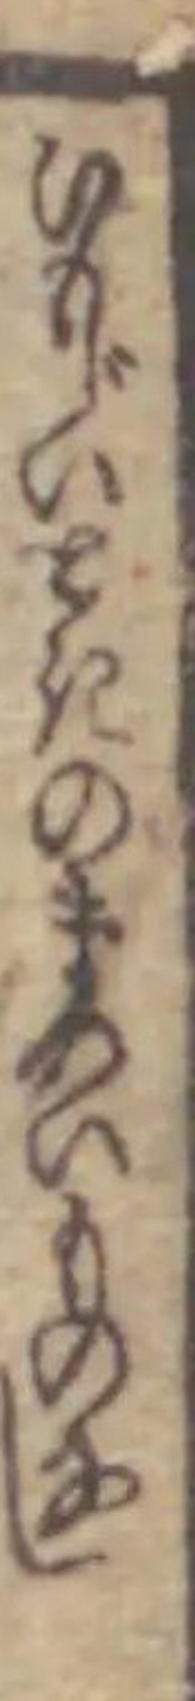ひもじいときのまついものなし
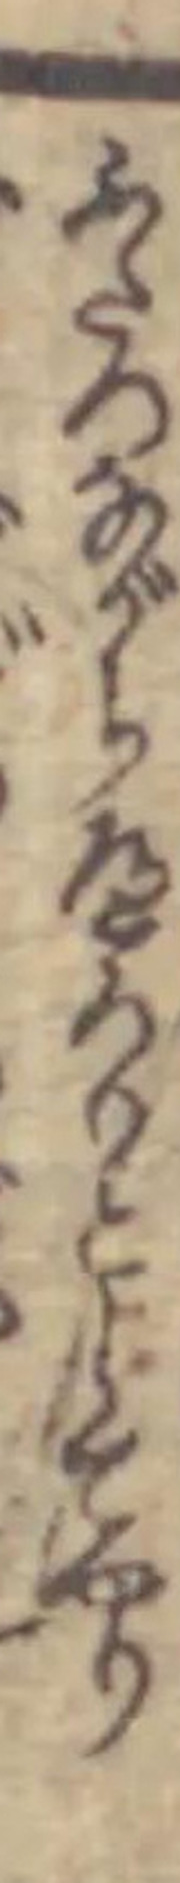ふたつながらへろりとしてやり
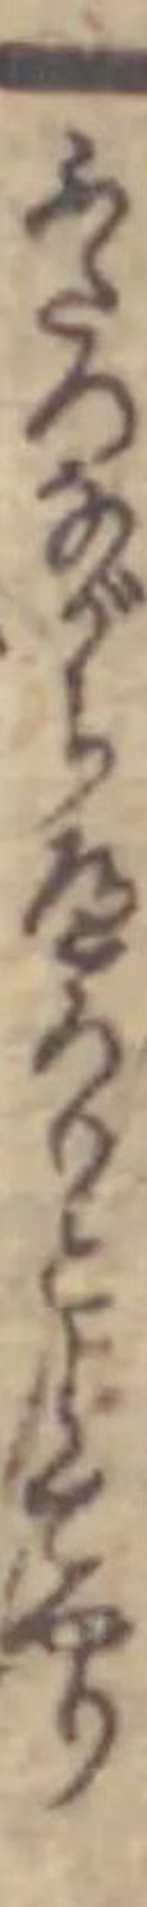ふたつながらへろりとしてやり
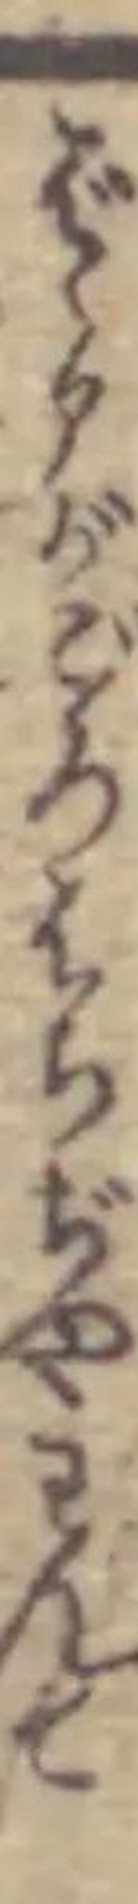ばゝアがごろはちぢやわんて
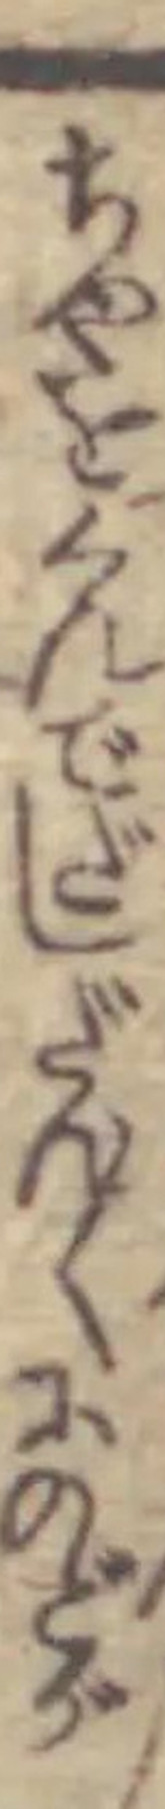ちやをくんでだしだん〳〵にのどが
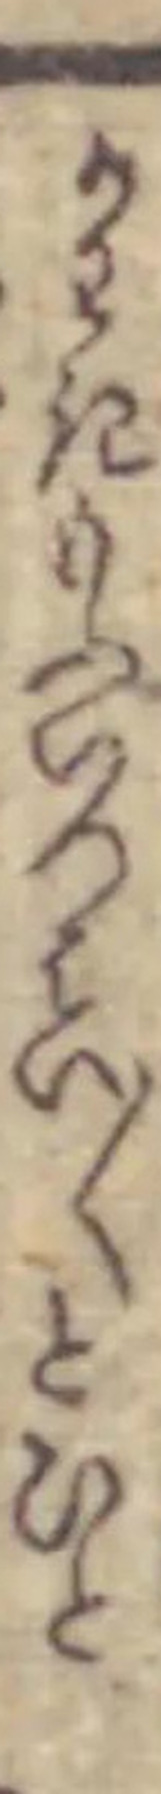かわきもふいつはい〳〵とひと
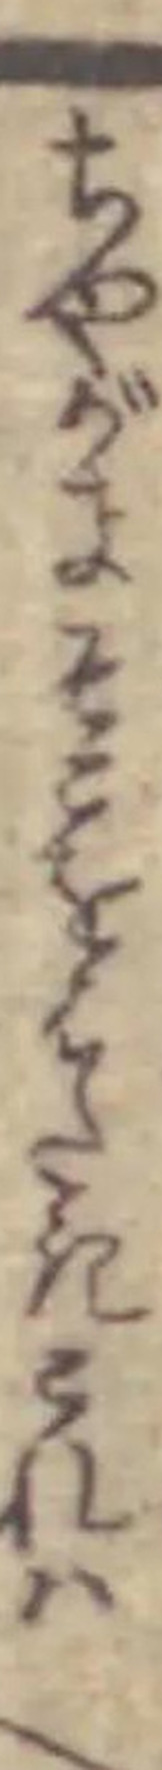ちやがまそこをはたきこれは
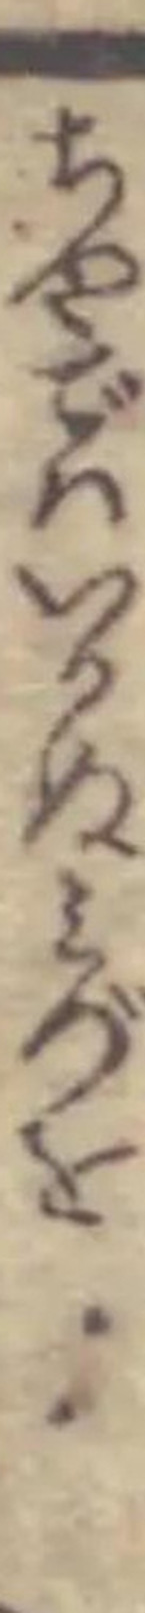ちやではいかぬみづを
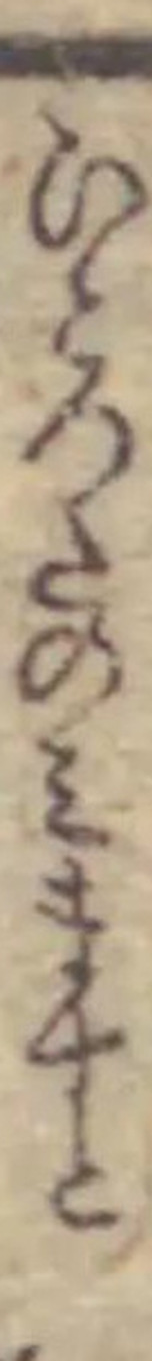ひとつたのみますと
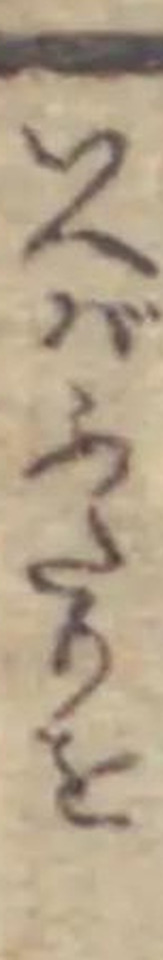いへばふたりを
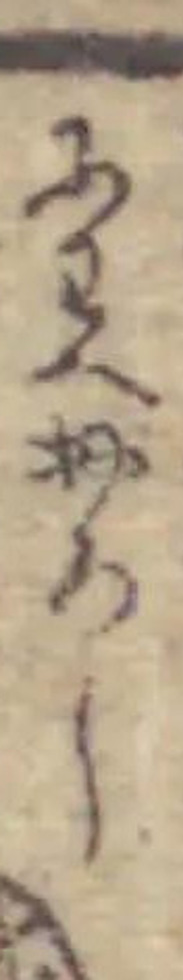にわへおろし
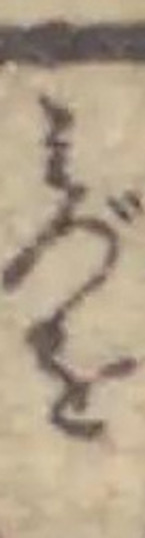みづを
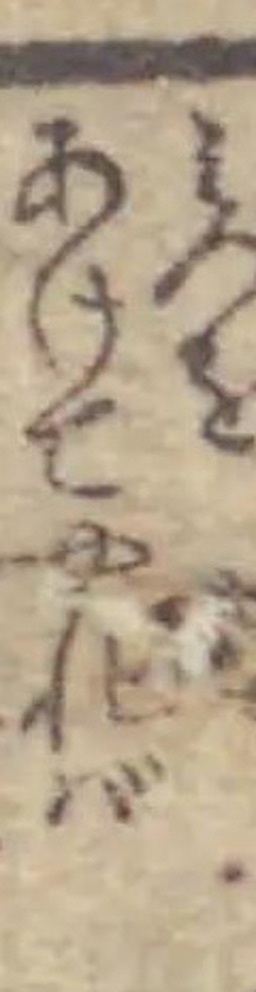あけてやれば
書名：もふもふもふ怖噺 2巻
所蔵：国立国会図書館 National Diet Library, JAPAN
